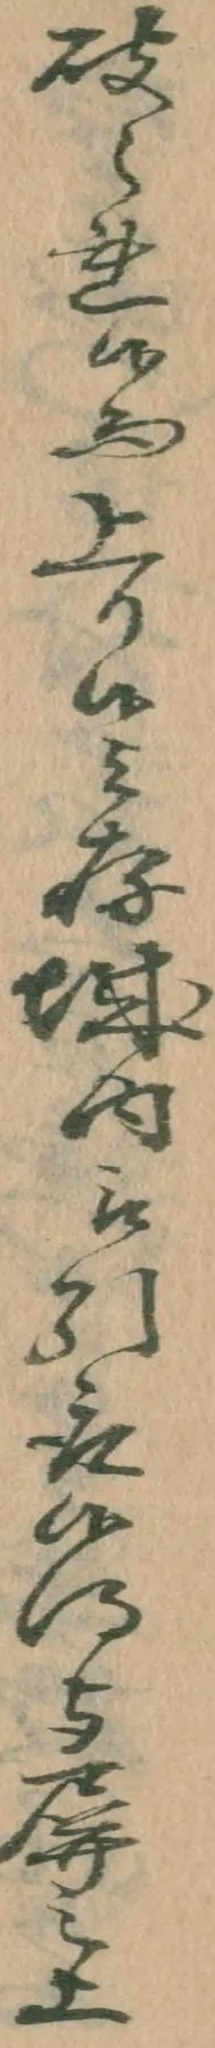破られ候而上り候と存城内江引取候得と屏之上
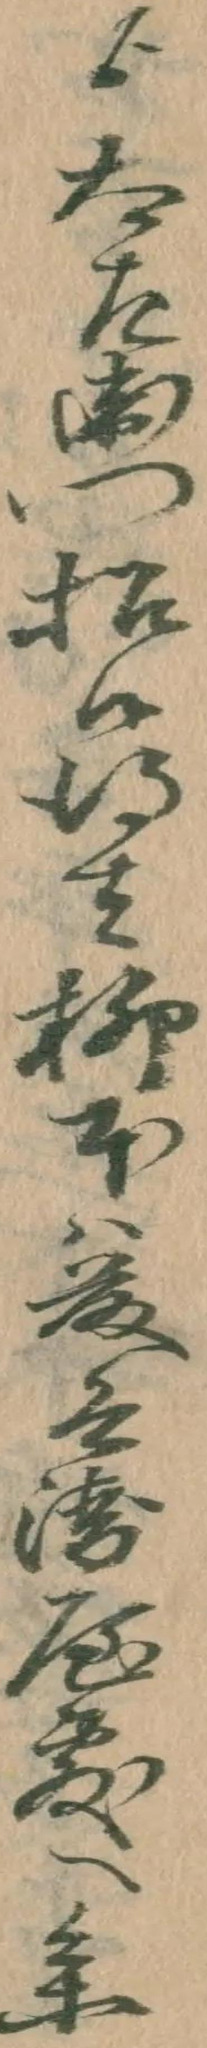ゟ太左衛門招候得は柳本は藤兵衛屋敷へ参
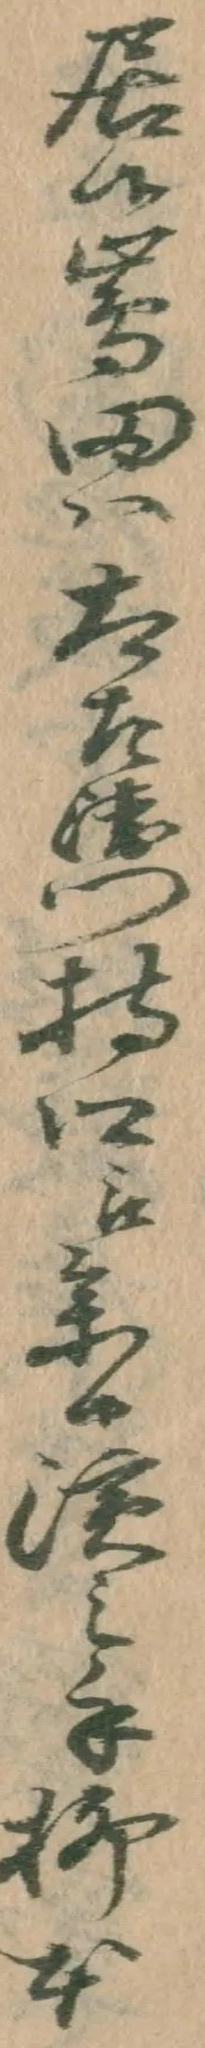居候島田八太左衛門持口江参候浜之手柳本
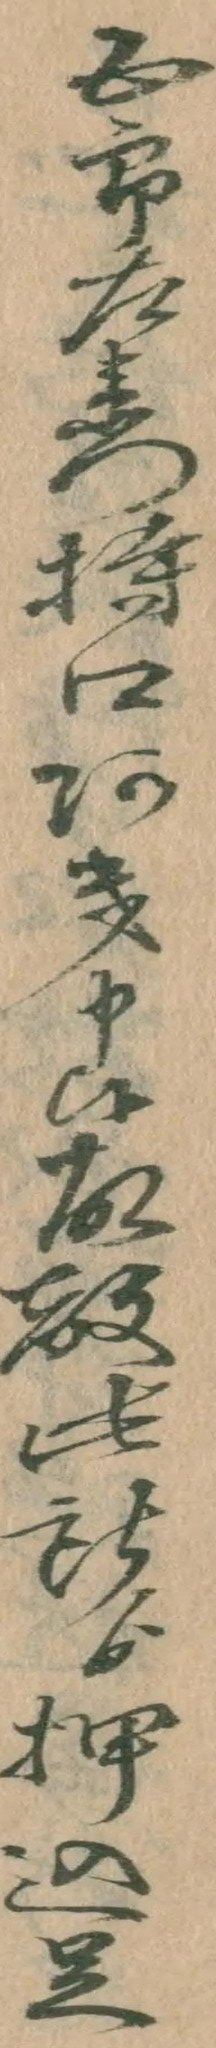五郎左衛門持口あき申候故敵此所ゟ押込足
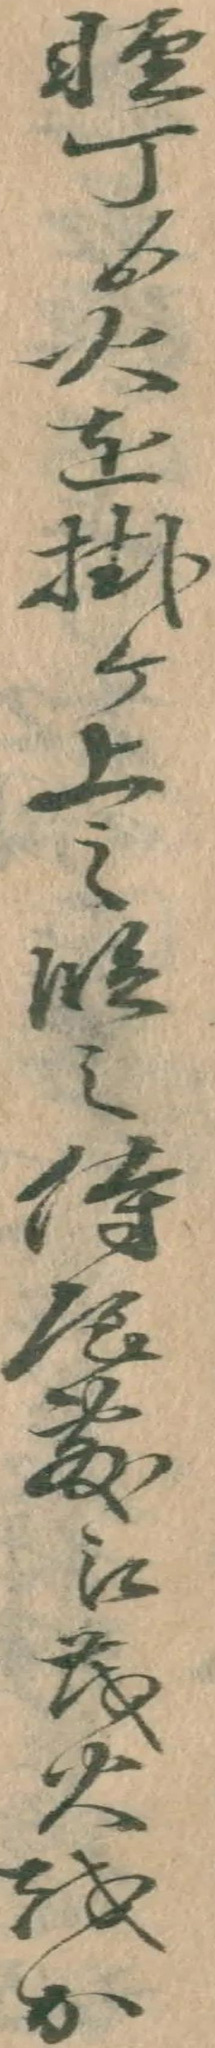軽丁ゟ火を掛ヶ上之段之侍屋敷江も火をか
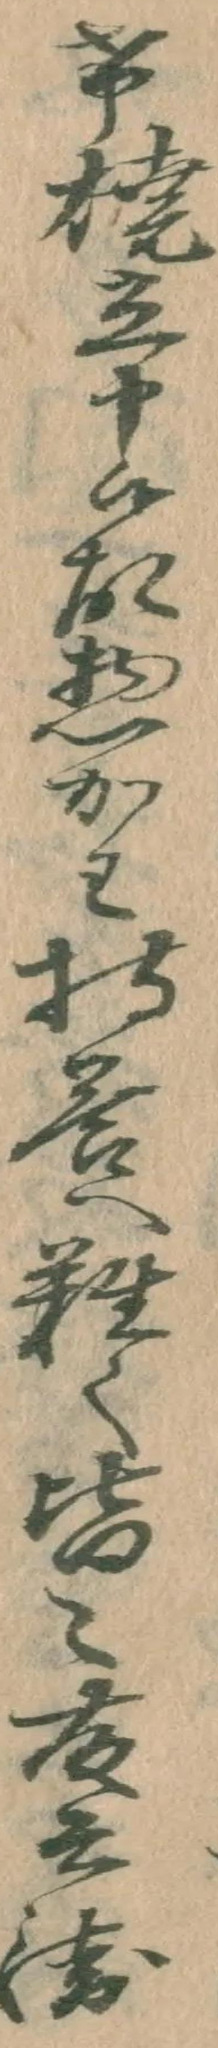け焼立申候故惣かわ持答へ難く皆々藤兵衛
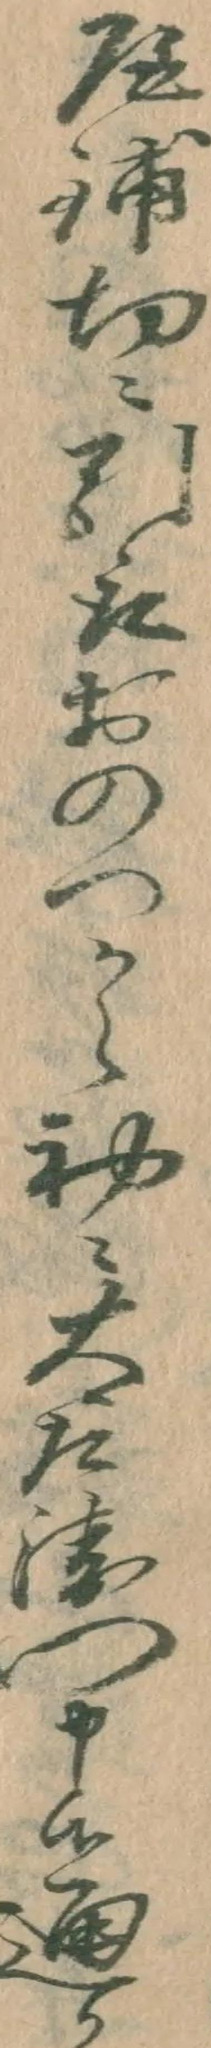屋鋪切に引取おのつから初に太左衛門申候通り
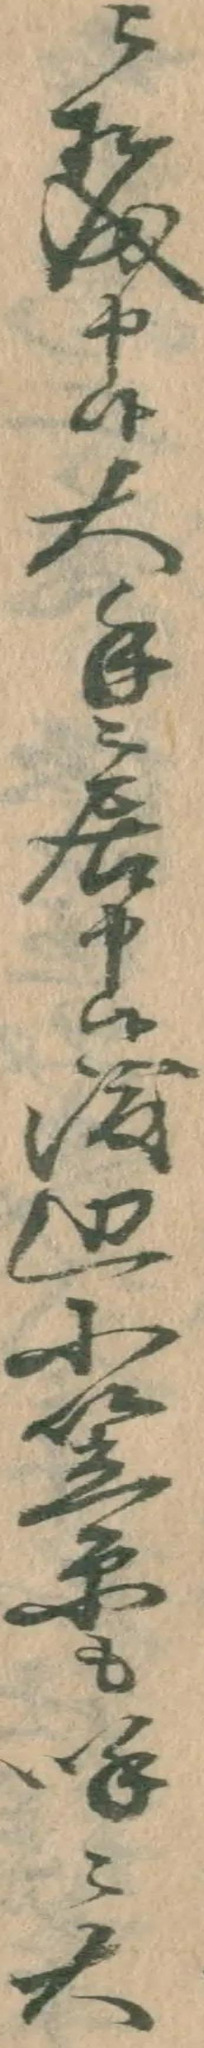に相成申候大手に居申候渡辺小笠原も呼に大
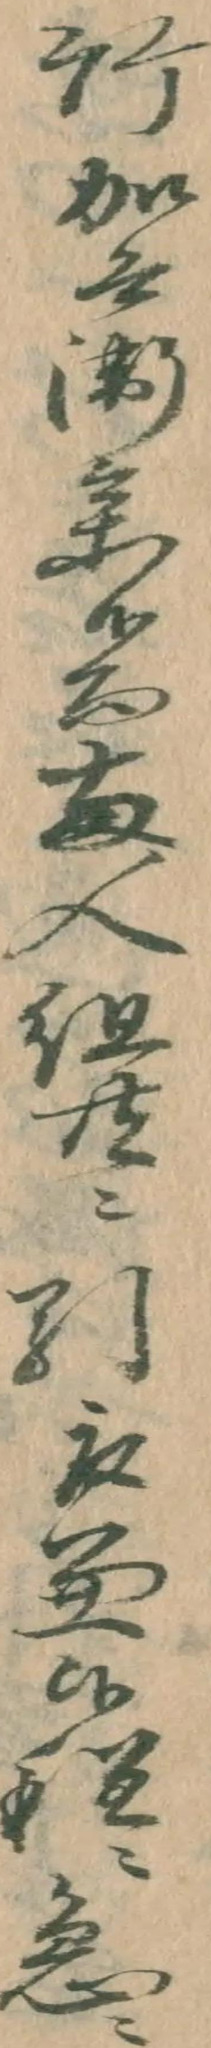竹加兵衛参候而両人組共に引取兼候程に急に
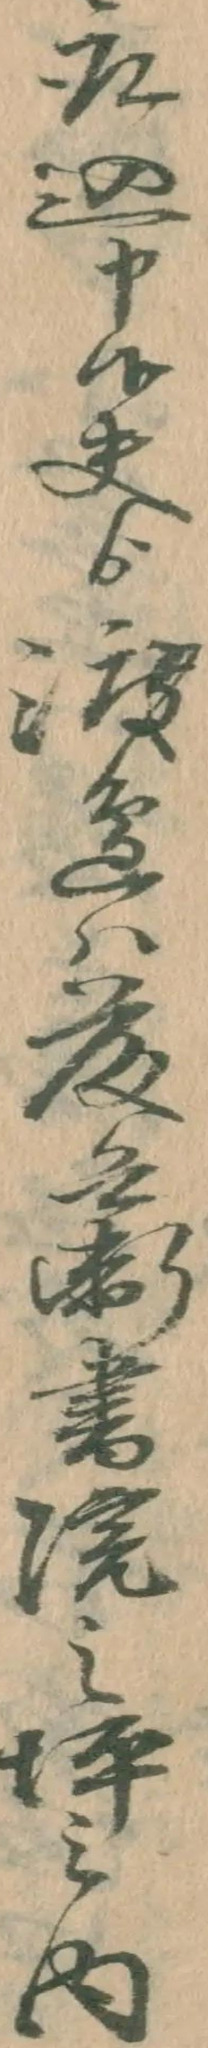取込申候夫ゟ渡辺は藤兵衛書院之坪之内

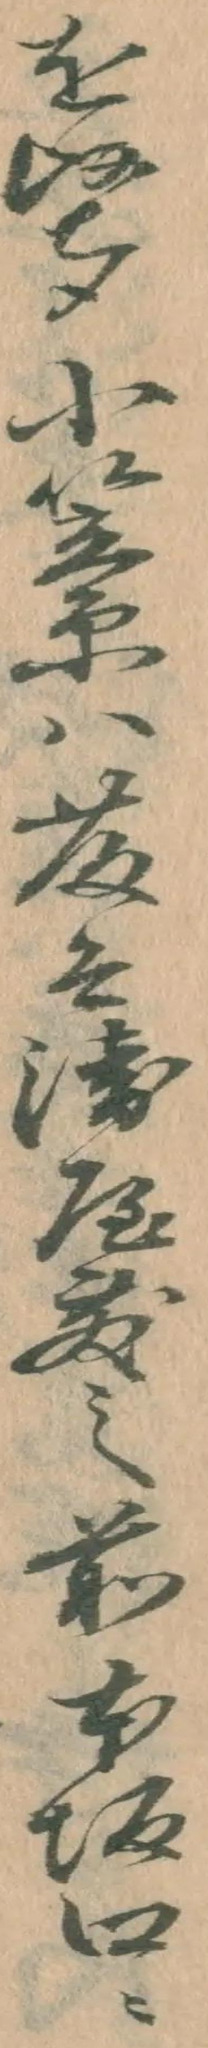を堅メ小笠原は藤兵衛屋敷之前本坂口に
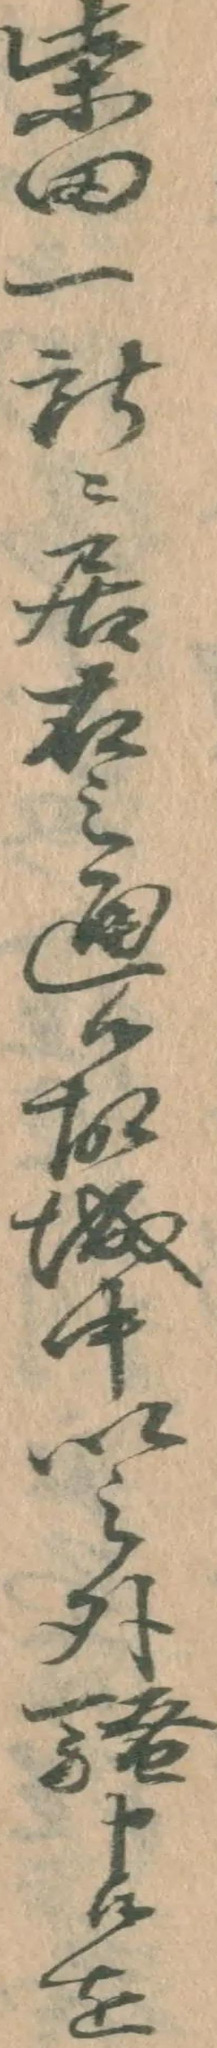柴田一所に居右之通候故城中以之外騒申候を
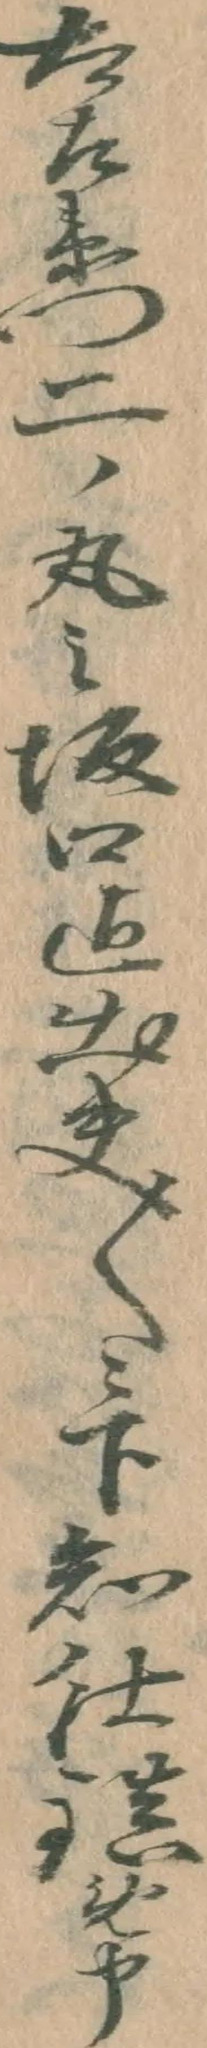太左衛門二ノ丸之坂口迄出夫〳〵に下知仕鎮め申
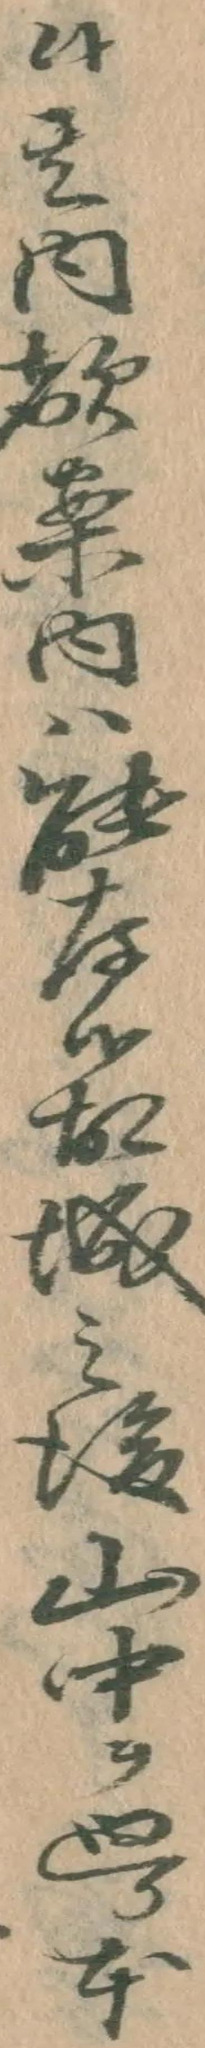候其内敵案内は能存候故城之後山中ヲ廻り本
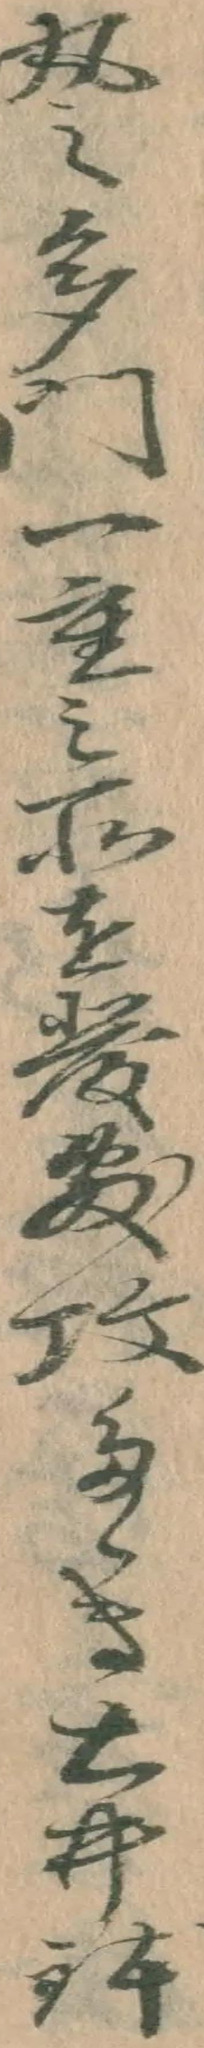丸之多門一重之所を厳敷攻たゝき土井鉢
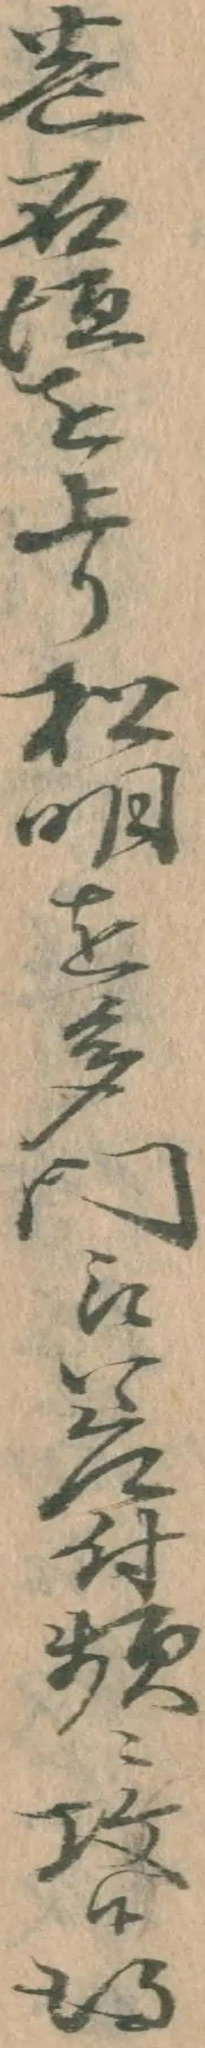巻石垣を上り松明を多門江差付頻に攻候得
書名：切支丹御退治記 49巻. [3]
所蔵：国立国会図書館 National Diet Library, JAPAN
